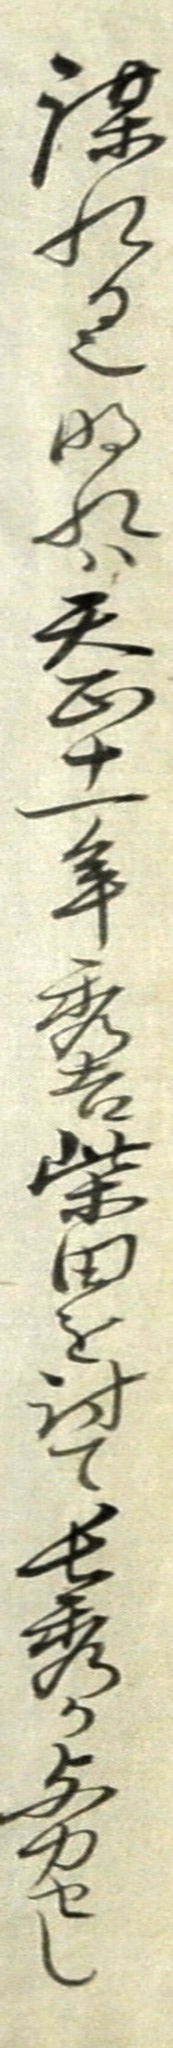謀れる也明れは天正十一年秀吉柴田を討て長秀か与力せし
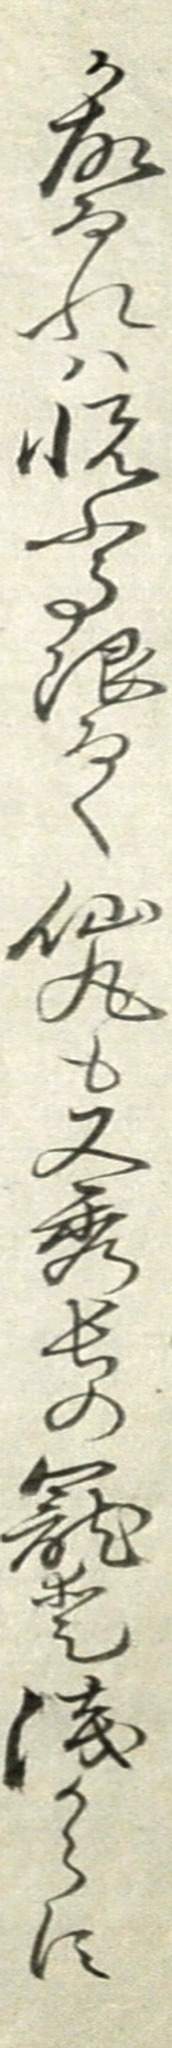か故なれは悦ふ事限なく仙丸も又秀長の寵愛浅からす
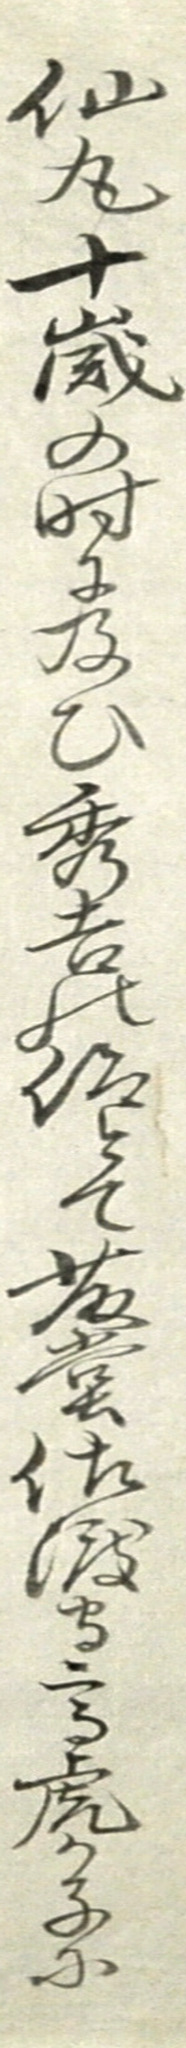仙丸十歳の時に及ひ秀吉の仰とて藤堂佐渡守高虎か子に
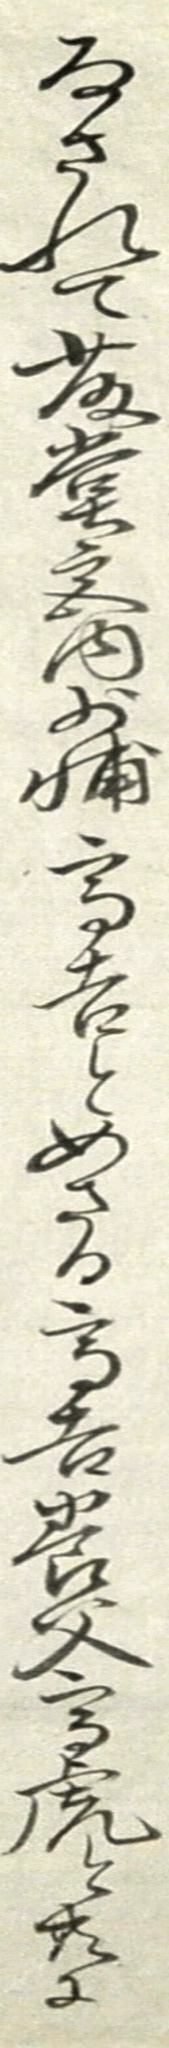なされて藤堂宮内少輔高吉とめさる高吉養父高虎と共に
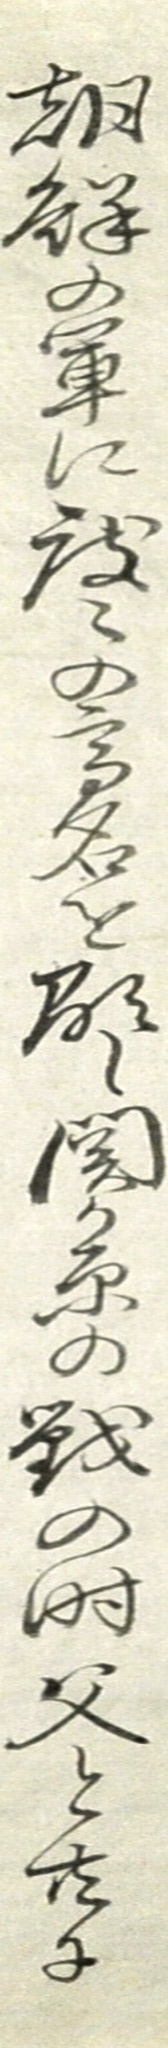朝鮮の軍に度々の高名を顕し関か原の戦の時父と共に
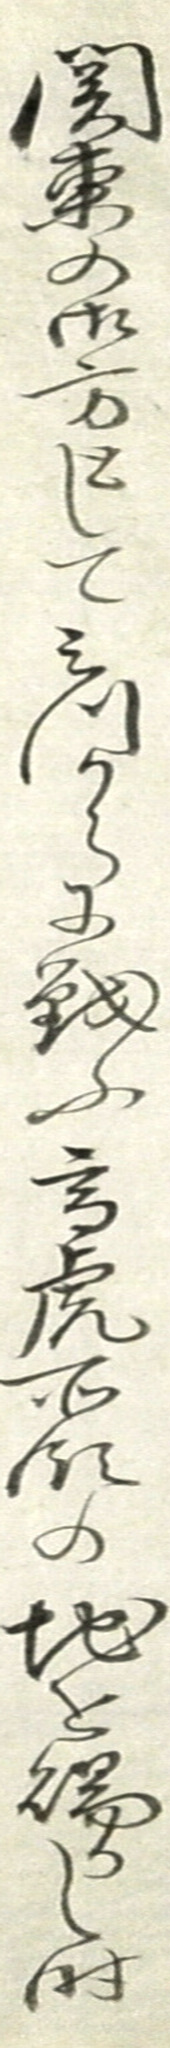関東の御方としてみつからに戦ふ高虎所領の地を賜りし時
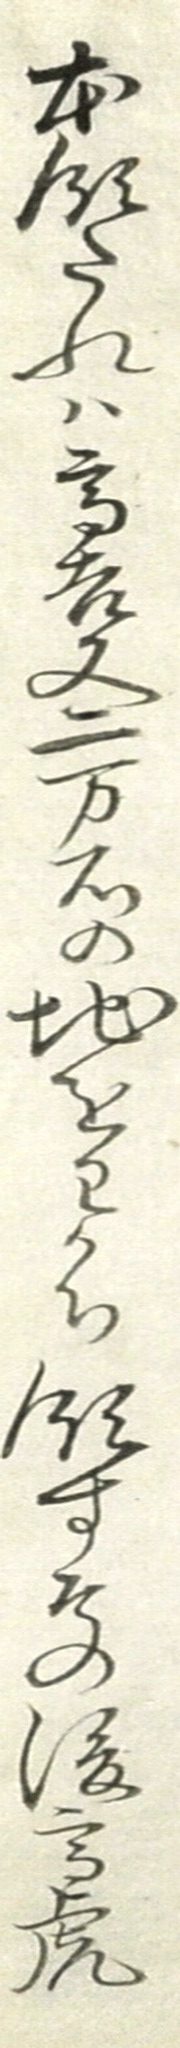本領たれは高吉又二万石の地をわかち領すその後高虎
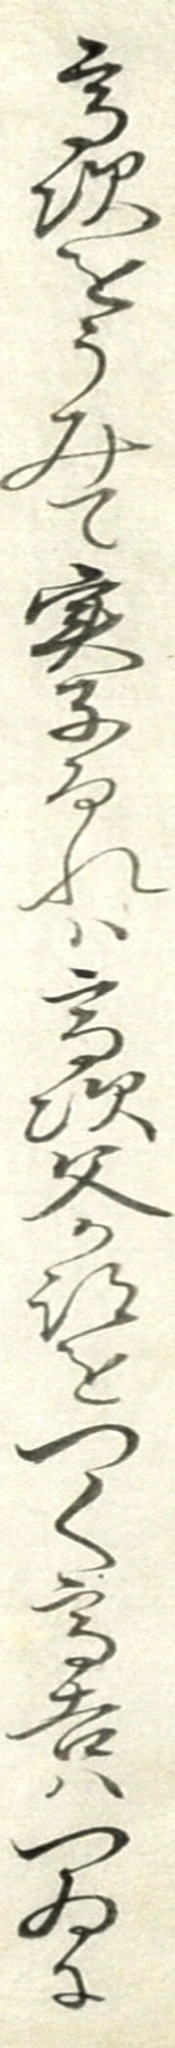高次をうみて実子なれは高次父か跡をつく高吉はつゐに
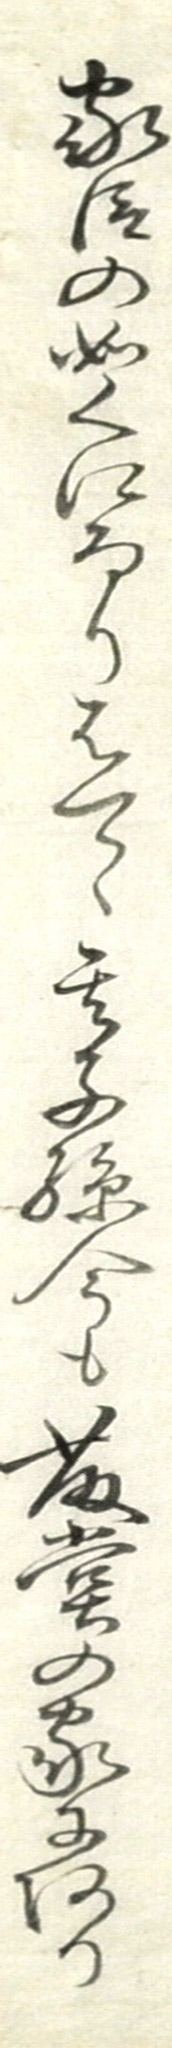家臣の如くになりはてゝ其子孫今も藤堂の家にあり
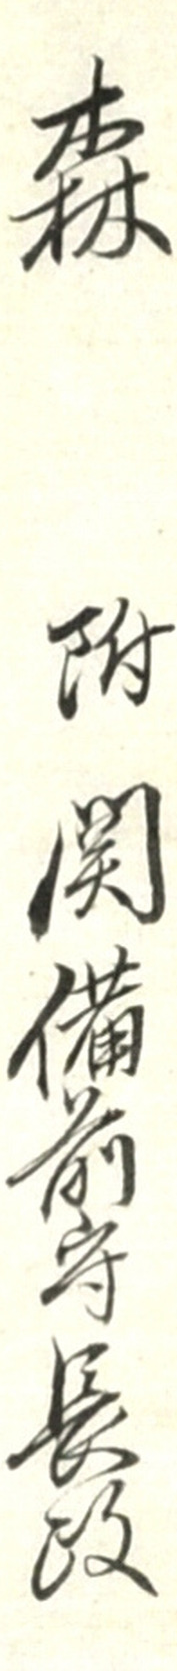森付関備前守長政
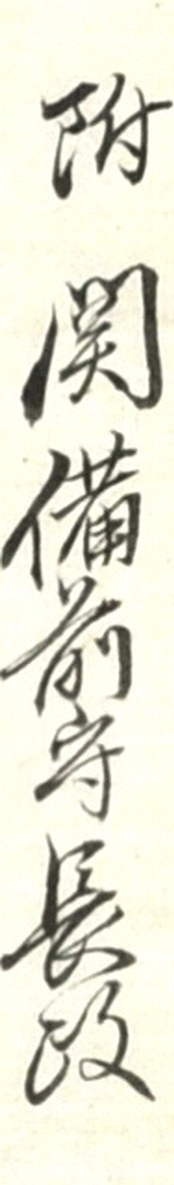森付関備前守長政
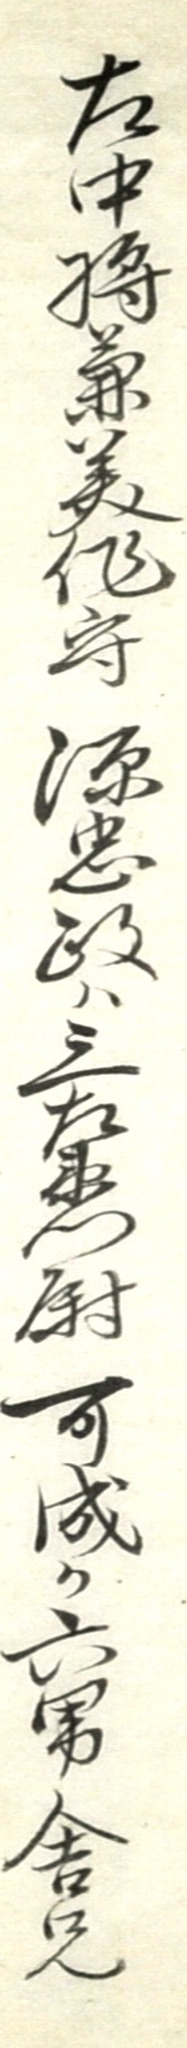左中将兼美作守源忠政は三左衛門尉可成か六男舎兄
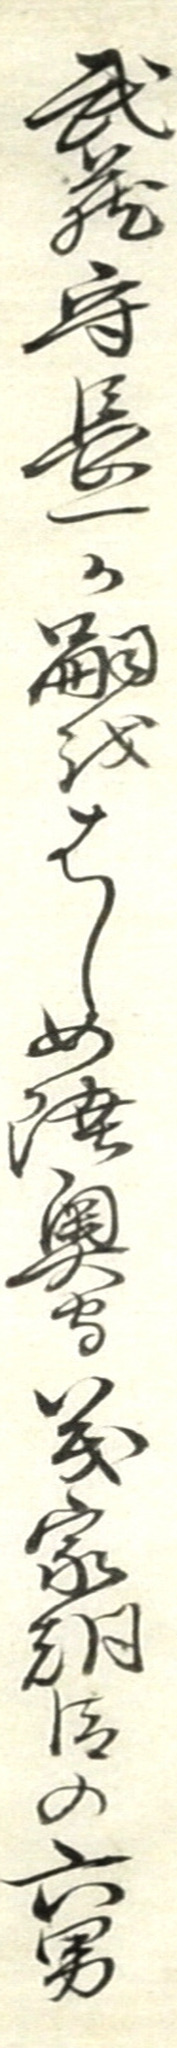武蔵守長一か嗣をはしめ陸奥守義家朝臣の六男
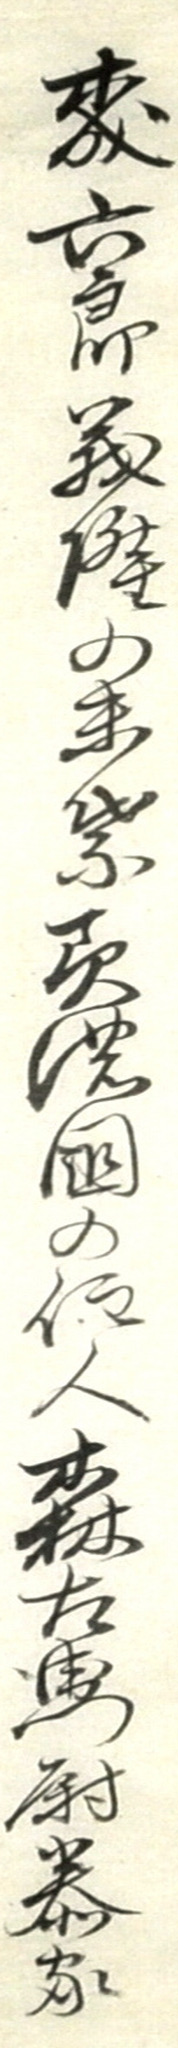守六郎義隆の末葉美濃国の住人守左衛門尉泰家
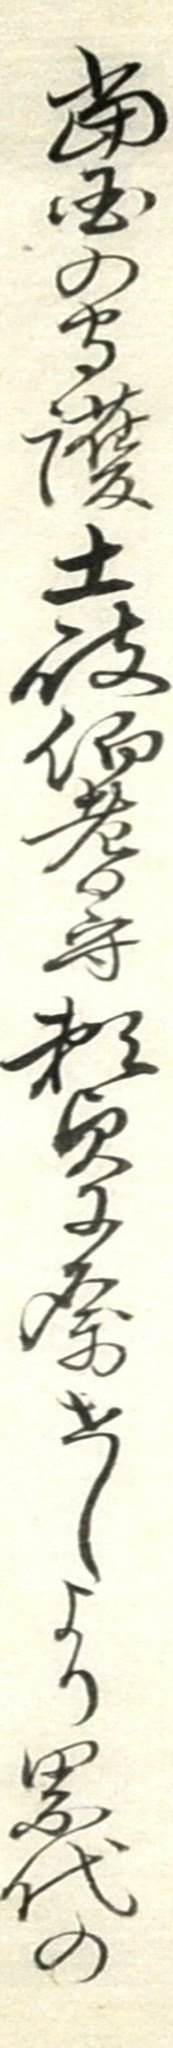当国の守護土岐伯耆守頼貞属せしより累代の
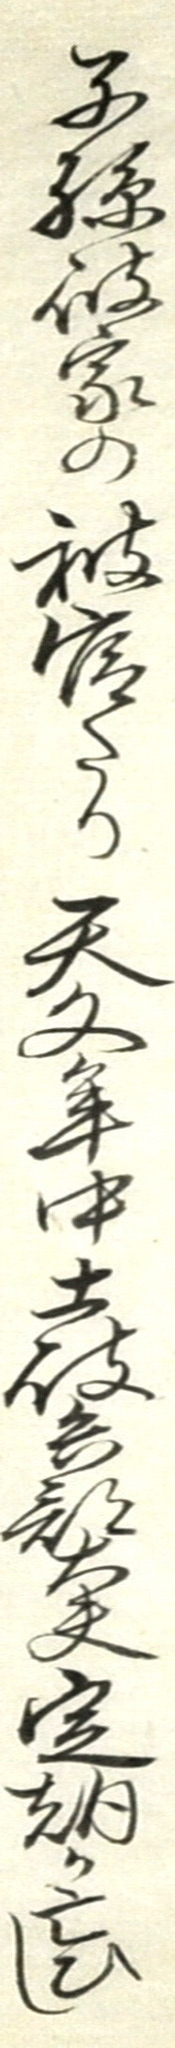子孫彼家の被官たり天文年中土岐兵部大夫定朝か亡ひし
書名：藩翰譜（七・下）
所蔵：伊那市立高遠町図書館・合同会社AMANE
